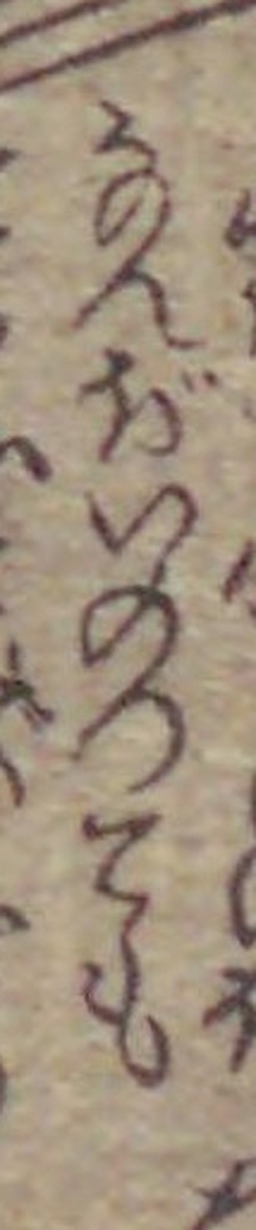なんぼいのつても
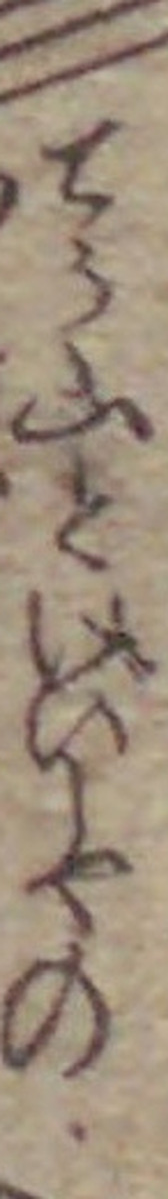てう山とげいしやの
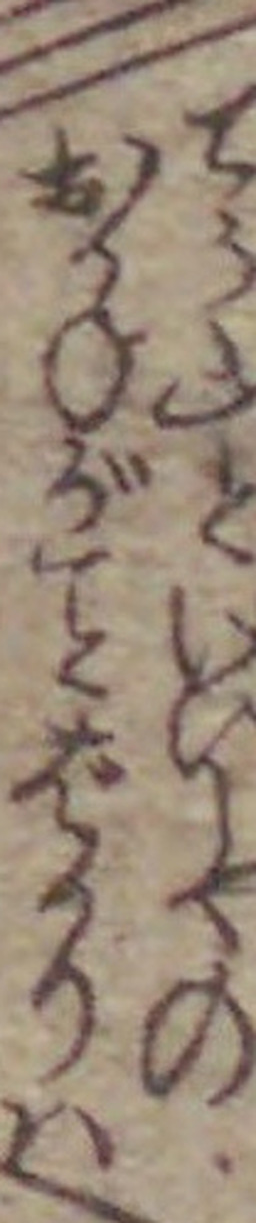おかねがことばかりは
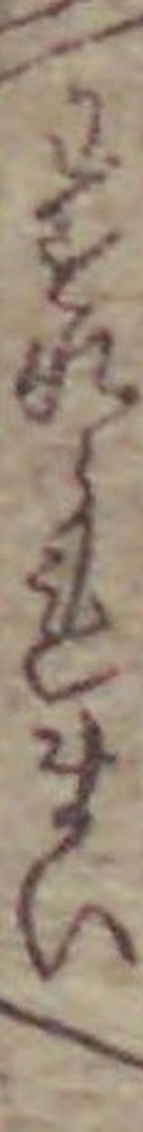わすれられまい
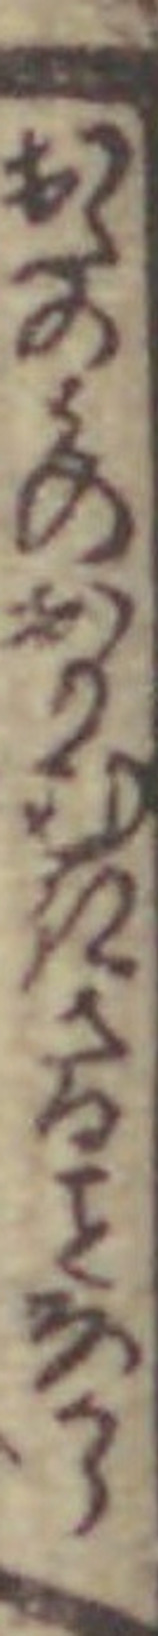おたのみのおもむきさることなから
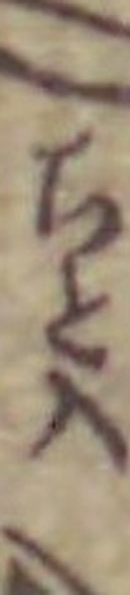ちと入
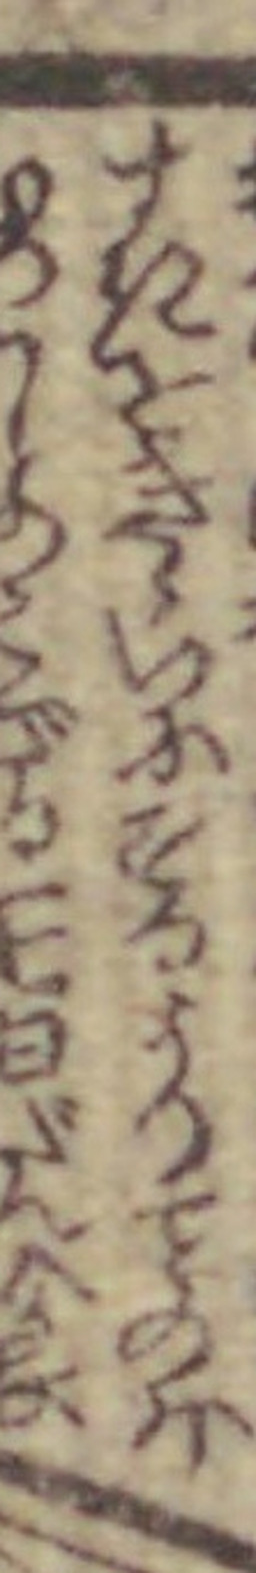むつかしふこざる一七日だん食
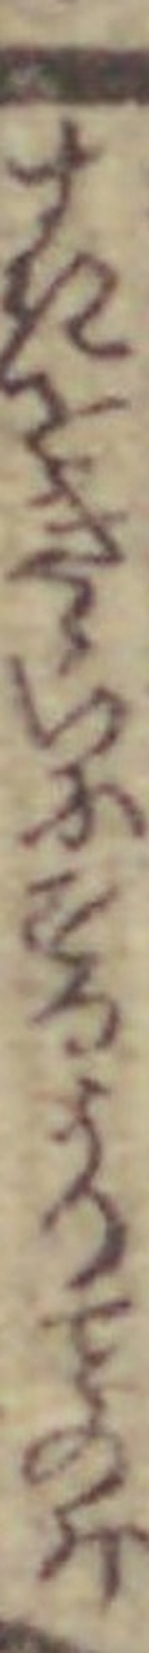すきをきらいにするよりことの外
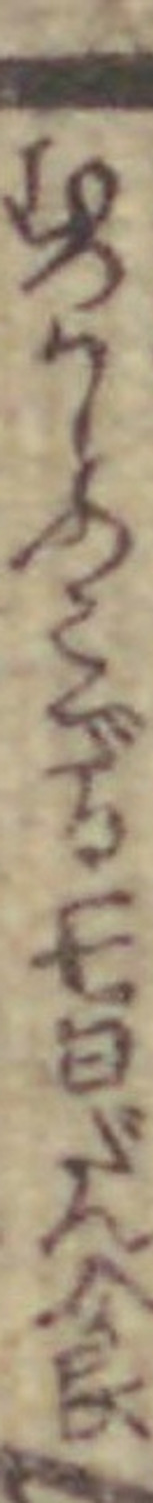むつかしふこざる一七日だん食
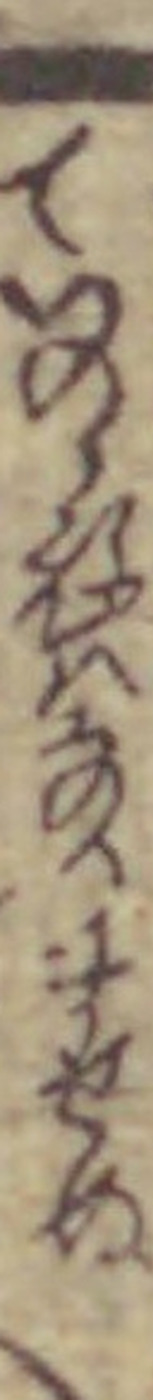ていのらねはなりませぬ
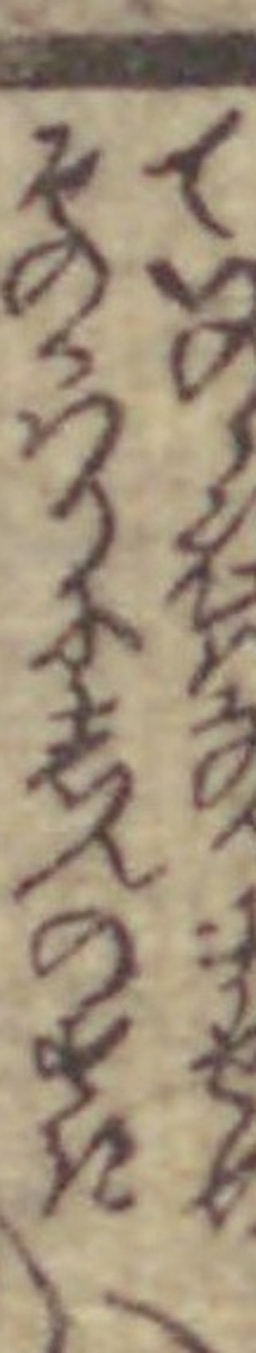そのかはりにしんのすき
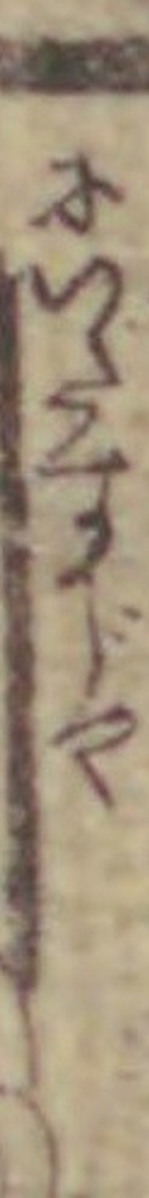にいたすじや
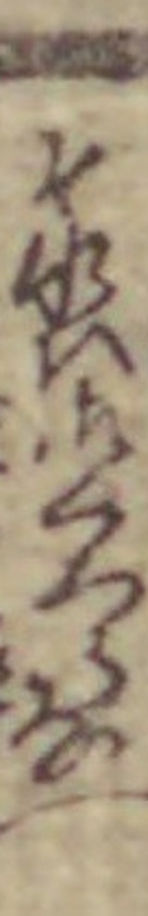それは御くろうな
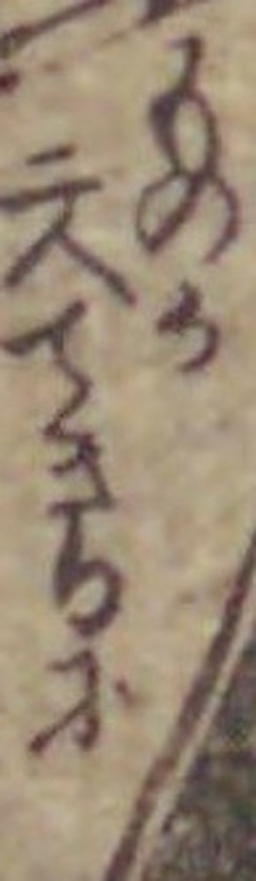二人てきるに
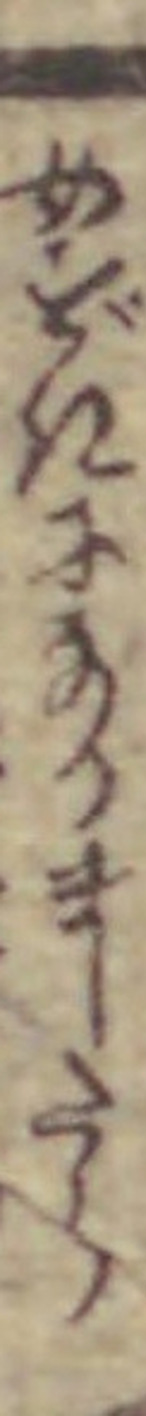女ずきになりましたら
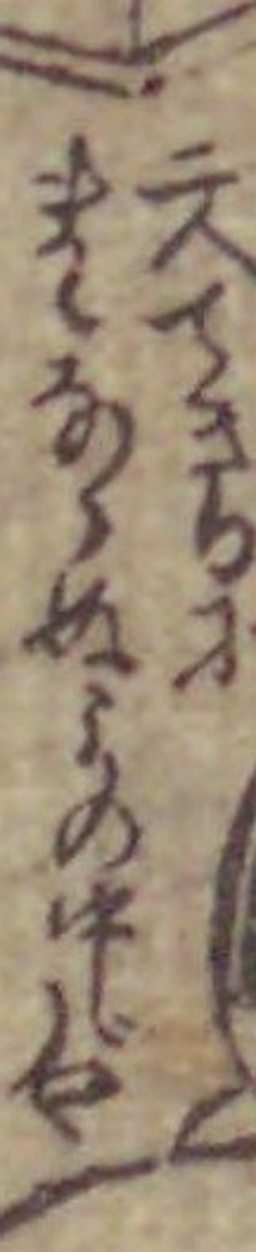まゝならぬよの中じや
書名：止而道致虚録 3巻
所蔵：国立国会図書館 National Diet Library, JAPAN
